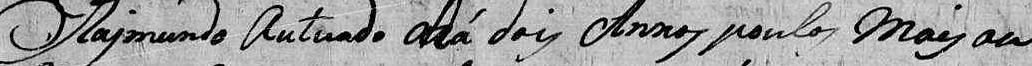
Rajmundo autuado há dois Annos pouCos mais ou
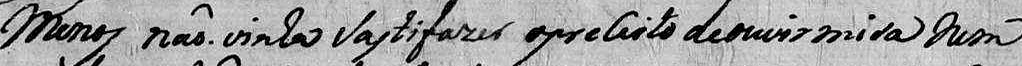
menos naõ. vinha sastifazer o preCeito de ouvir misa nem
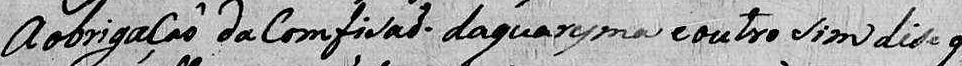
a obrigaÇaõ da Comfisaõ. da quaresma e outrosim dise q̄
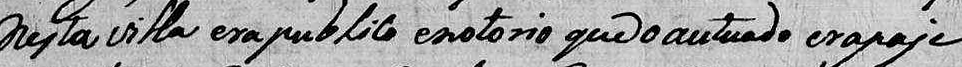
nesta villa era publiCo e notorio que o autuado era paje
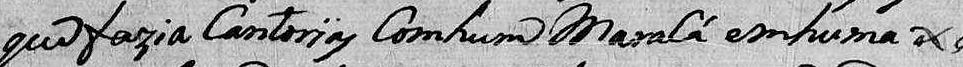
que fazia Cantorias Com hum ManaCá em huma xo
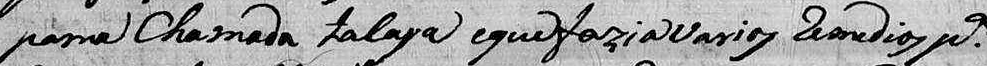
pana Chamada toCaya e que fazia varios Remedios p.a
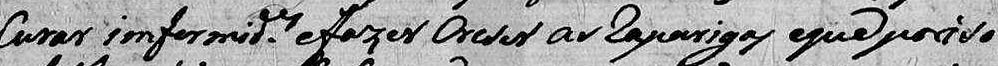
Curar imfermid.es e fazer Creser as Raparigas e que por iso
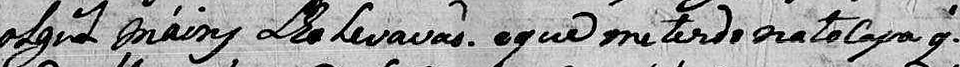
alguās máins lhe levavaõ. e que metendo na toCaya q̄.
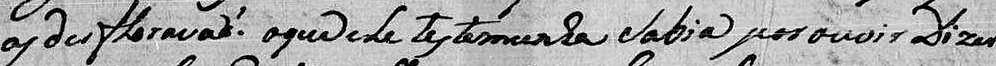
os desfloravaõ. o que ele testemunha sabia por ouvir Dizer
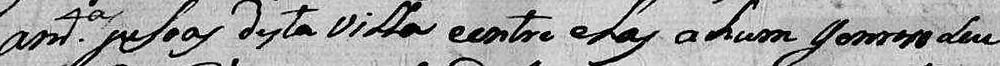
a m.tas pesoas desta villa e entre elas a hum Genroro seu
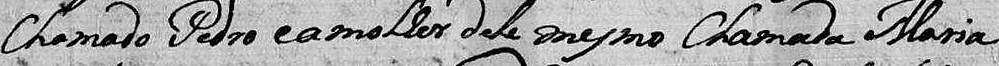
Chamado Pedro e a molher dele mesmo Chamada Maria
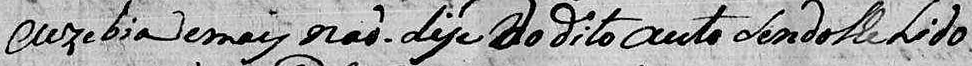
euzebia e mais naõ. dise do dito auto sendolhe lido
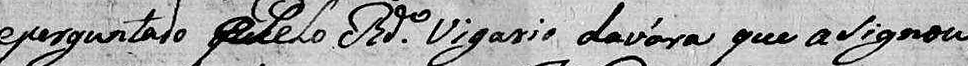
e perguntado Pelo Rd.o vigario da vára que asignou
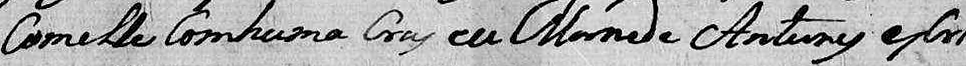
Com elle Com huma Crus eu Mamede Antunes esCri
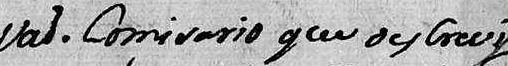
vaõ. Comisario que o esCrevy.
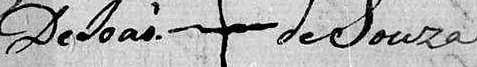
De Ioaõ + de Souza
